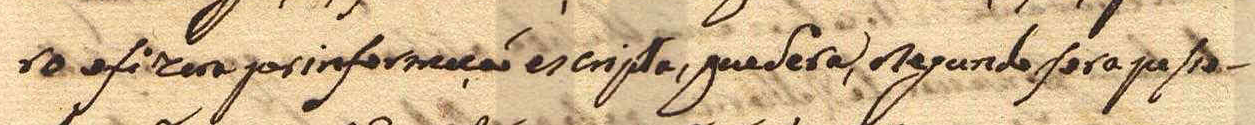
ro o fizera por informaçaõ escripta, que sera, o segundo fora pesso
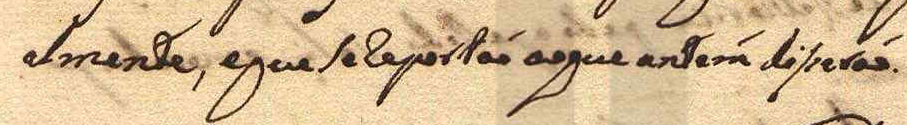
almente, e que se Reportaõ ao que antam disseraõ.
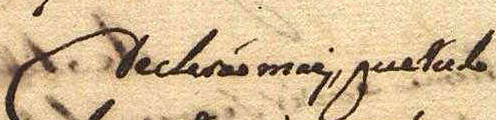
Declaraõ mais, que tudo
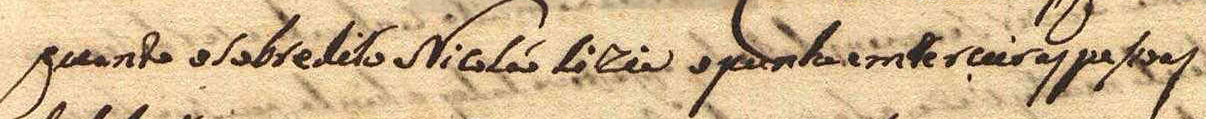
quanto o sobredito Nicoláo dizia o punha em terceiras pessoas
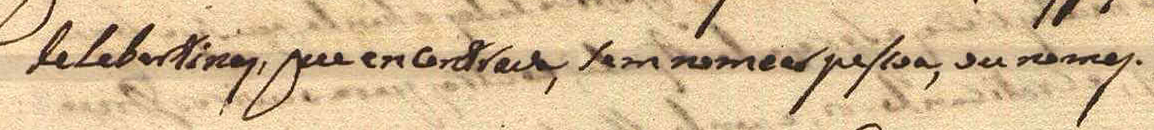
de lebertinas, que encontrava, sem nomear pessoa, ou nomes.
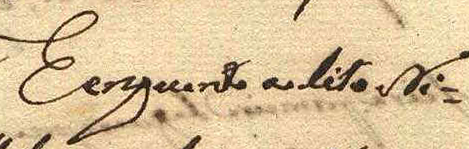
E enquanto ao dito Ni
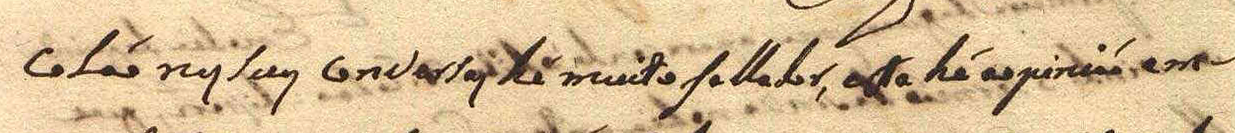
coLáo nas suas conversas hé muito fallador, esta hé a opiniaõ em
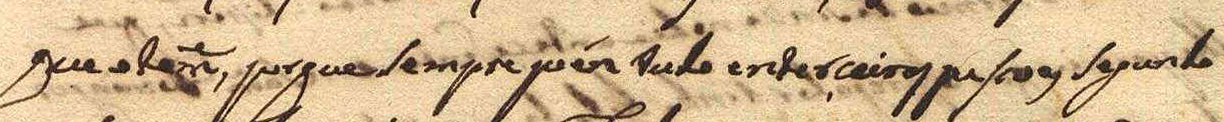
que o tem̄, porque sempre poém tudo en terceiras pessoas segundo
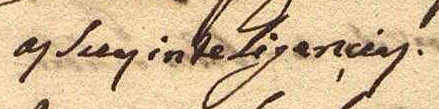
as suas inteligencias.
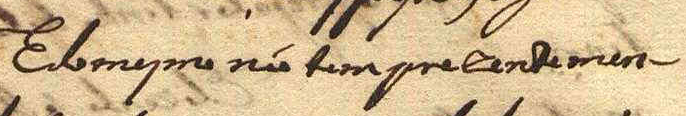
E do mesmo não tem prezentemen
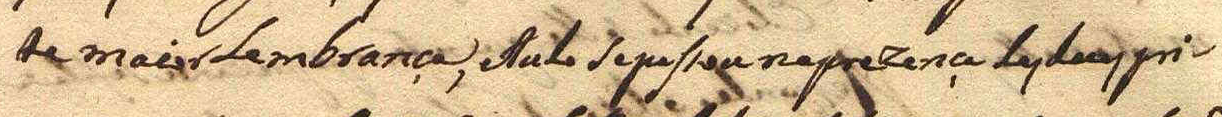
te maior Lembrança, e tudo se passou na prezença das duas pri
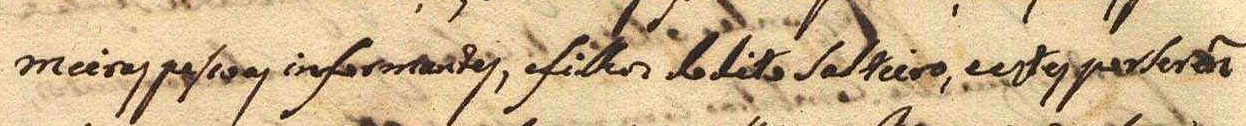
meiras pessoas informantes, e filhos do dito Salteiro, e estes por seren̄
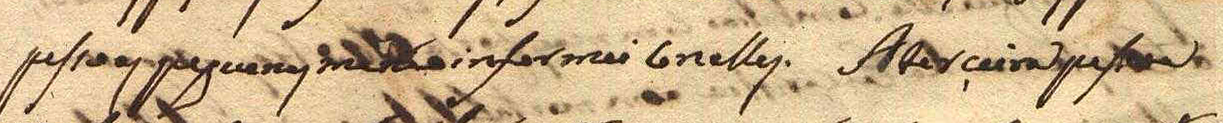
pessoas pequenas me não informei con elles. A terceira pessoa
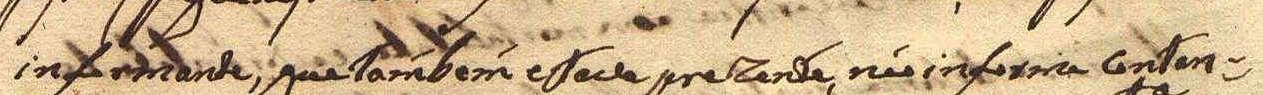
informante, que tambem estava prezente, não informa con tan
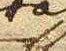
ta
